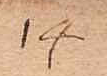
14
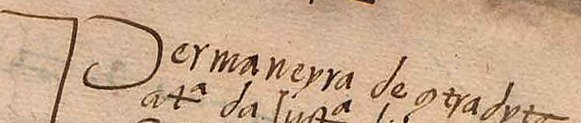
Per maneyra de ꝯtradyta
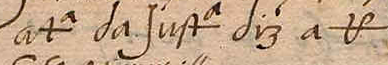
a ta da Justa diz a R
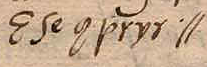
E se ꝯpryr.//
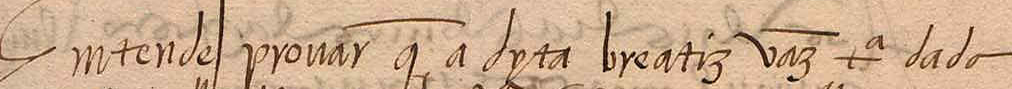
Emtende prouar q̄ a dyta breatiz vāz ta dada
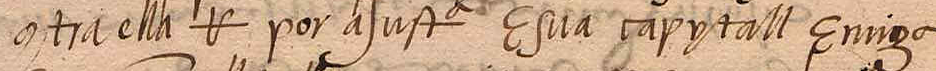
ꝯtra ella R por a Justa E sua capytall Emiga
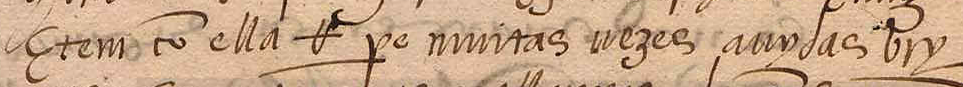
E tem cō ella R ꝑe muitas uezes auydas bry
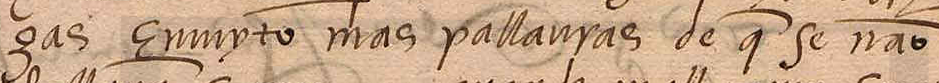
gas E muyto mas pallauras de q̄ se não
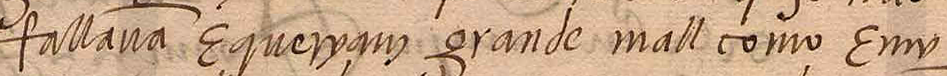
fallauā E queryam grande mal como Emy
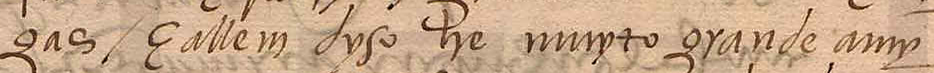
gas / E allem dyso he muyto grande amy
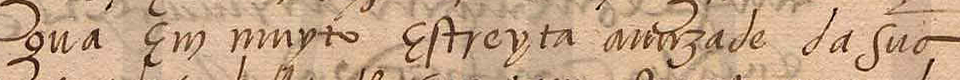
gua Em muyto Estreyta amizade da sua
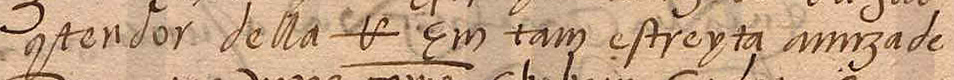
ꝯtendor della R Em tam estreyta amizade
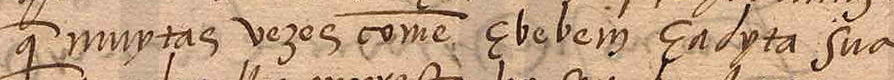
q̄ muytas vezes c̄ome E bebem E a dyta sua
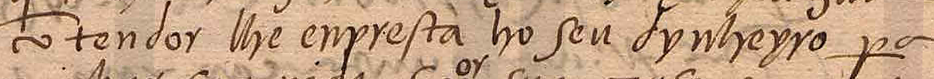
c̄otendor lhe enpresta ho seu dynheyro ꝑa
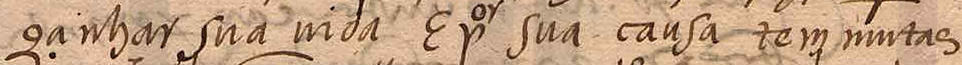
ganhar sua uida E por sua causa tem mutas
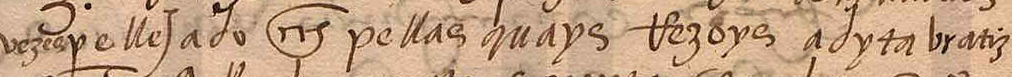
vezes pelleJado c̄cꝭ pellas quays Rezoys a dyta bratiz
